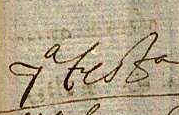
7a testa
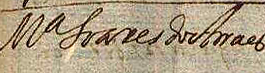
Ma Soares do Arraes
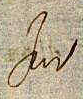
Jur
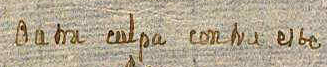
Outra culpa contra este
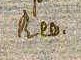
Reo.
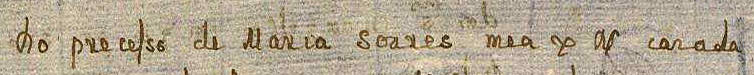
Do processo de Maria Soares mea x N cazada
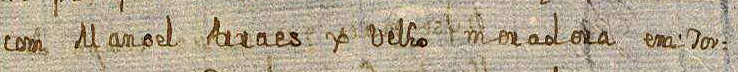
com Manoel Arraes x Velho moradora em Tor
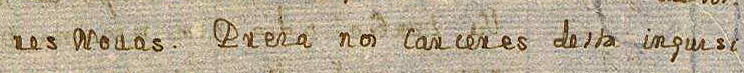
nes Nouas. Preza nos Carceres desta inquisi
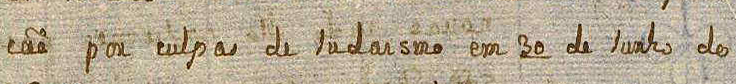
caõ por culpas de Iudaismo em 30 de Iunho de
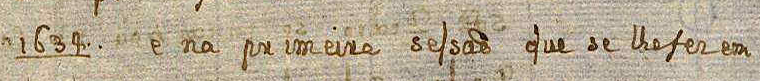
1634. e na primeira sessaõ que se lhe fez em
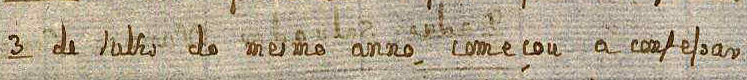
3 de Iulho do mesmo anno, começou a confessar
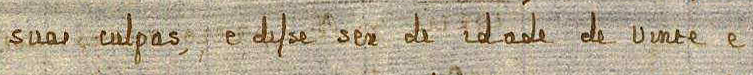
suas culpas, e disse ser de idade de vinte e
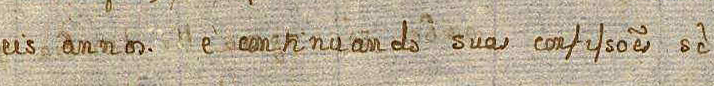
seis annos. e continuando suas confissoẽs sē
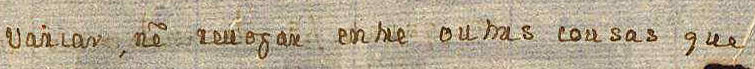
variar, nē reuogar entre outras cousas que
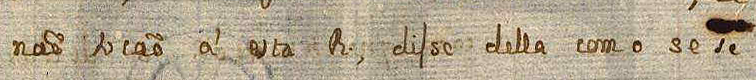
naõ tocaõ á esta R., disse della como se se
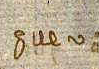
gue
